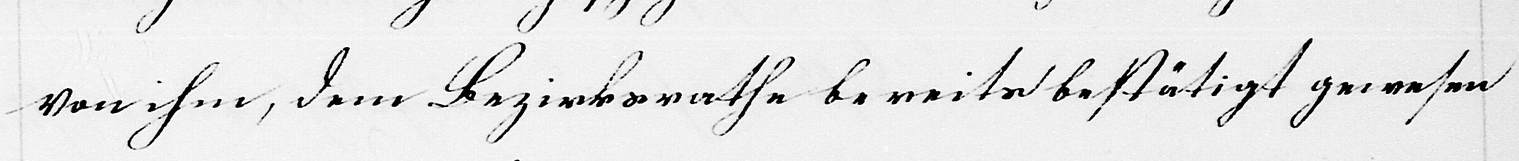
von ihm, dem Bezirksrathe bereits bestätigt gewesen
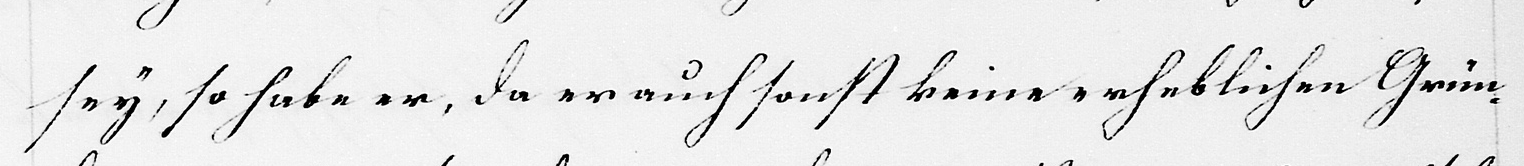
sey, so habe er, da er auch sonst keine erheblichen Grün¬
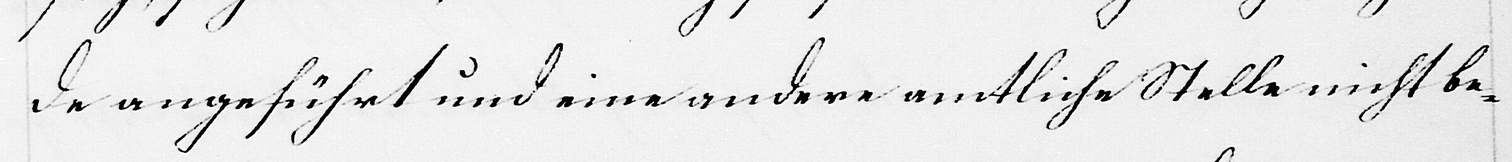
de angeführt und eine andere amtliche Stelle nicht be¬
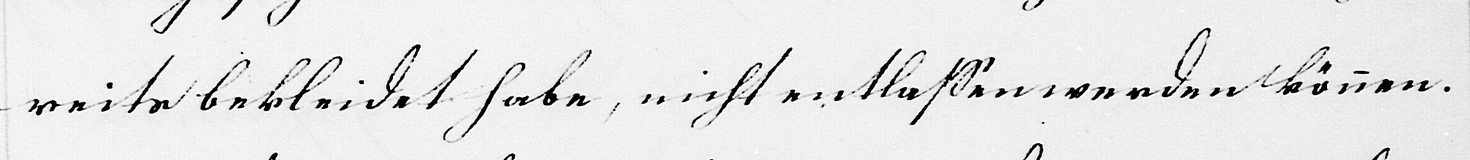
reits bekleidet habe, nicht entlaßen werden können.
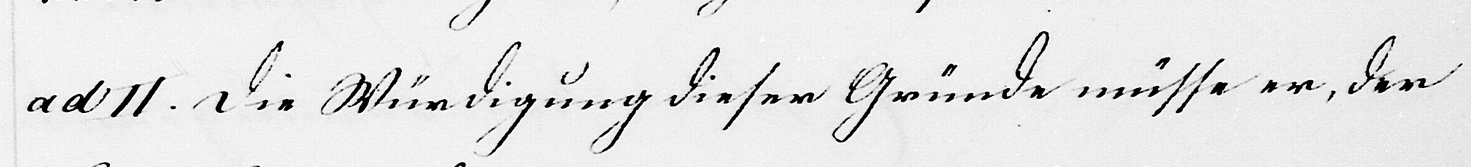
ad II. Die Würdigung dieser Gründe müsse er, der
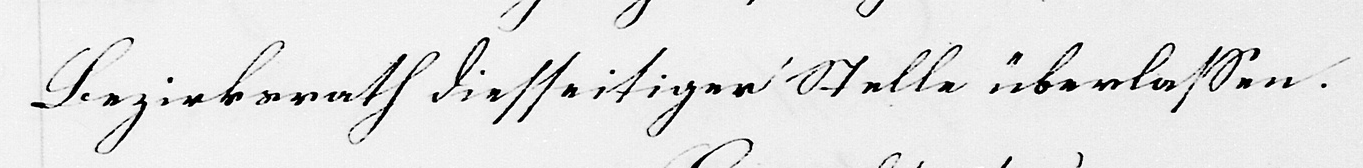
Bezirksrath diesseitiger Stelle überlaßen.
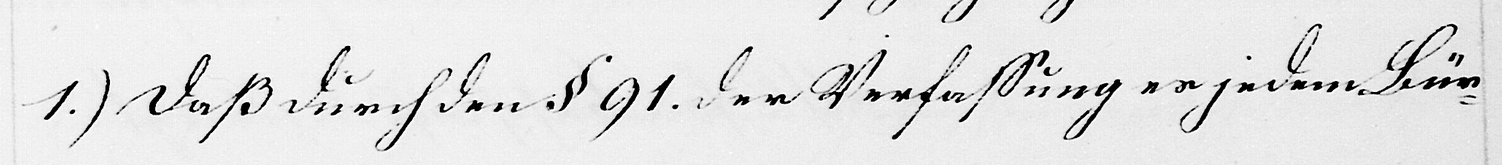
1.) Daß durch den § 91. der Verfaßung es jedem Bür¬
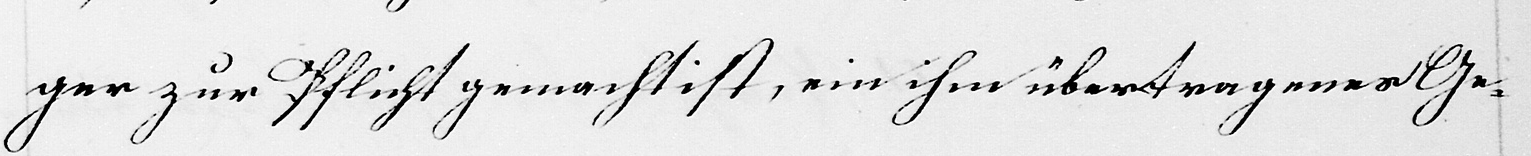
ger zur Pflicht gemacht ist, ein ihm übertragenes Ge¬
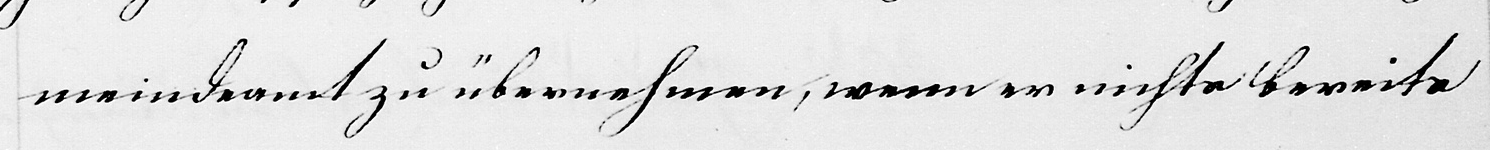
meindeamt zu übernehmen, wenn er nichts bereits
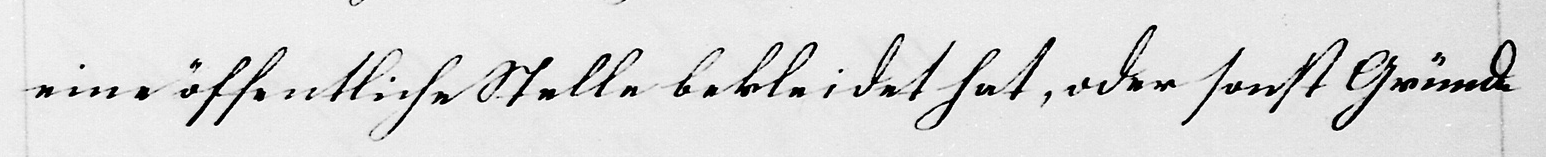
eine öffentliche Stelle bekleidet hat, oder sonst Gründe
